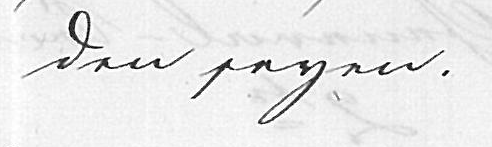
den seyen.
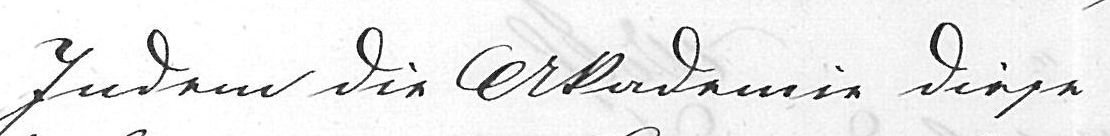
Indem die Akademie diese
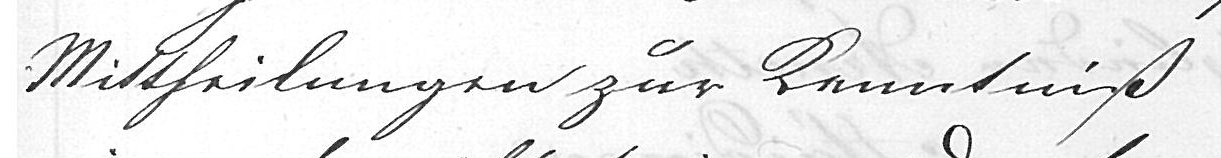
Mittheilungen zur Kenntniß
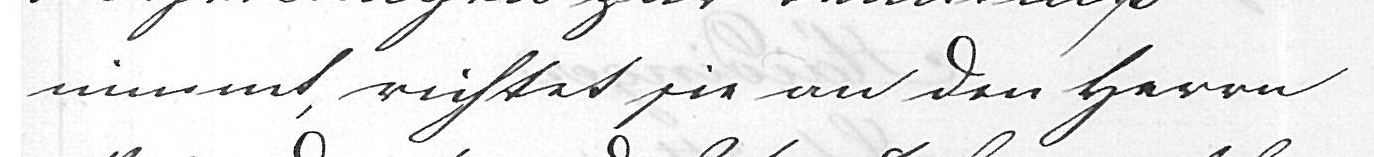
nimmt, richtet sie an den Herrn
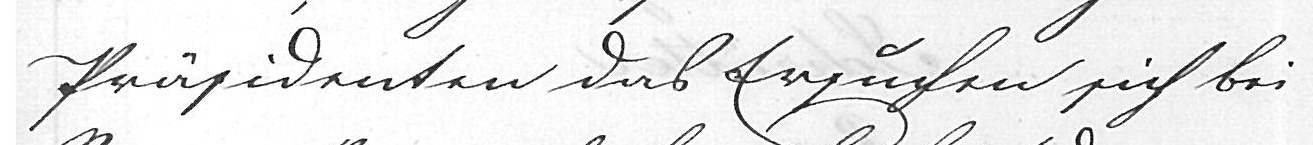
Präsidenten das Ersuchen sich bei
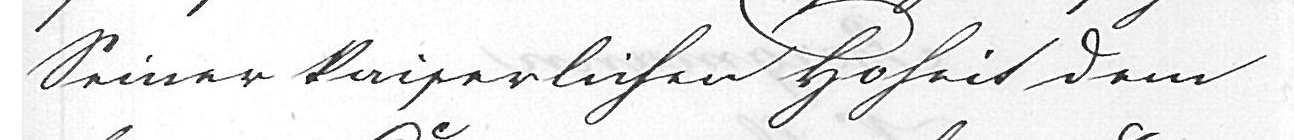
Seiner kaiserlichen Hoheit dem
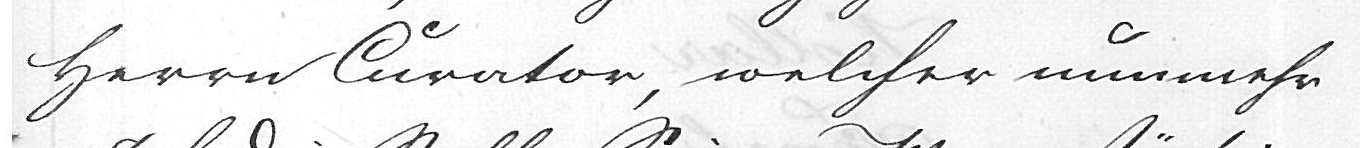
Herrn Curator, welcher nunmehr
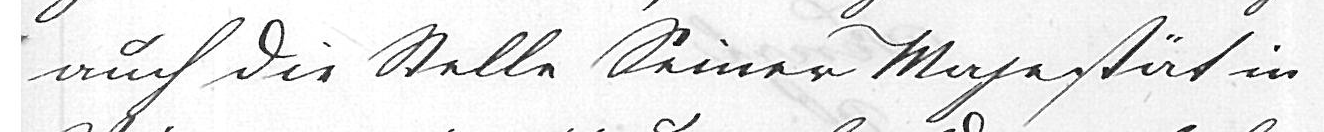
auch die Stelle Seiner Majestät in
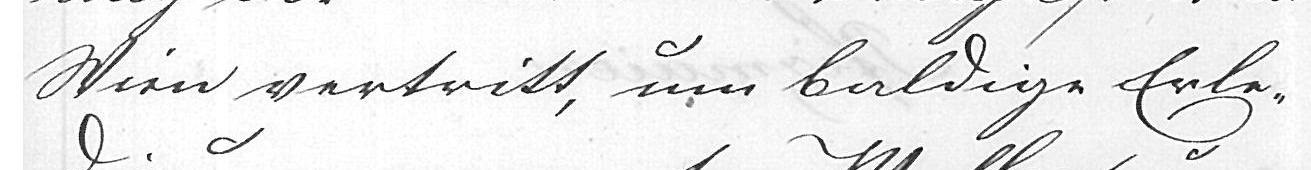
Wien vertritt, um baldige Erle-
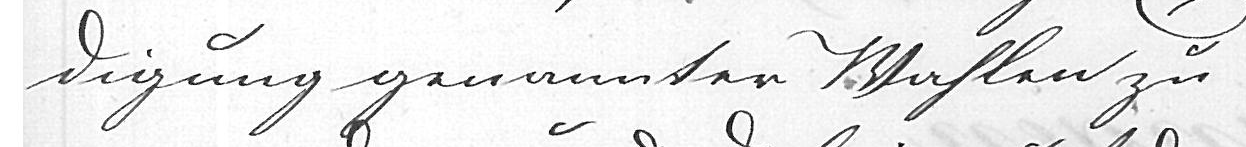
digung genannter Wahlen zu
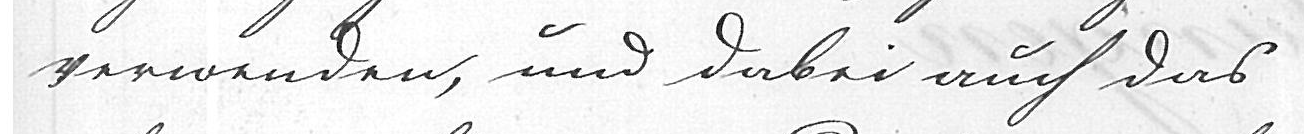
verwenden, und dabei auch das
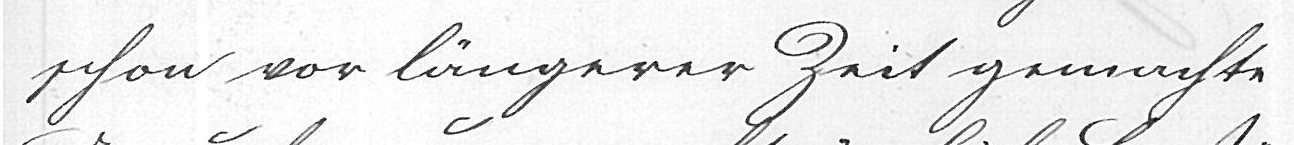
schon vor längerer Zeit gemachte
